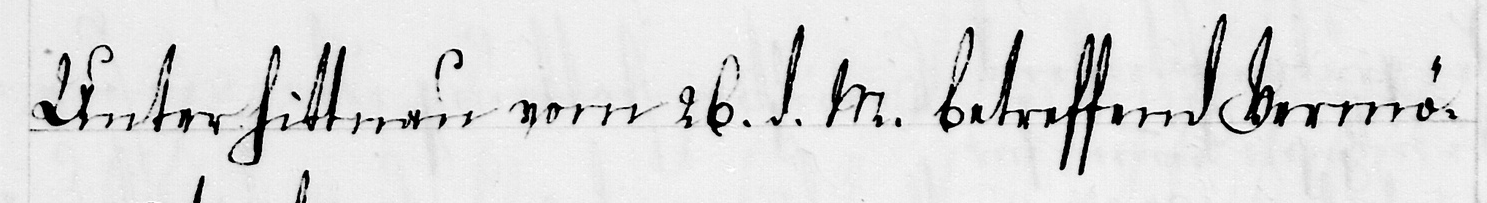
Unterhittnau vom 26 d. M. betreffend Vermö¬
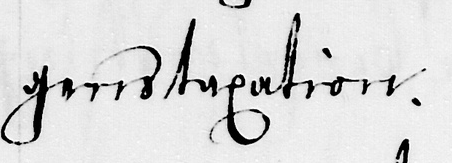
genstaxation.
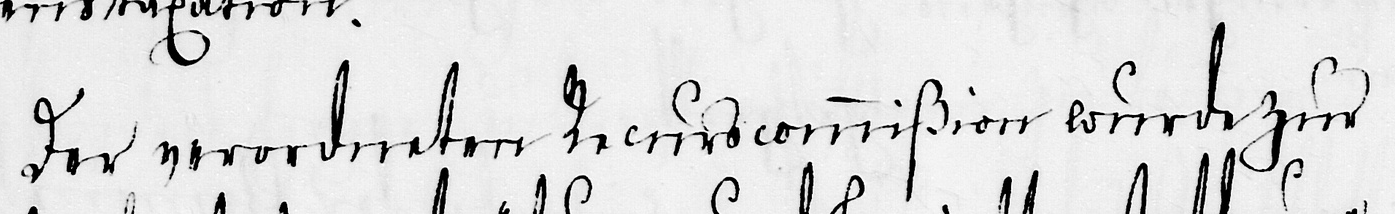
Der verordneten Recurscommißion wurde zur
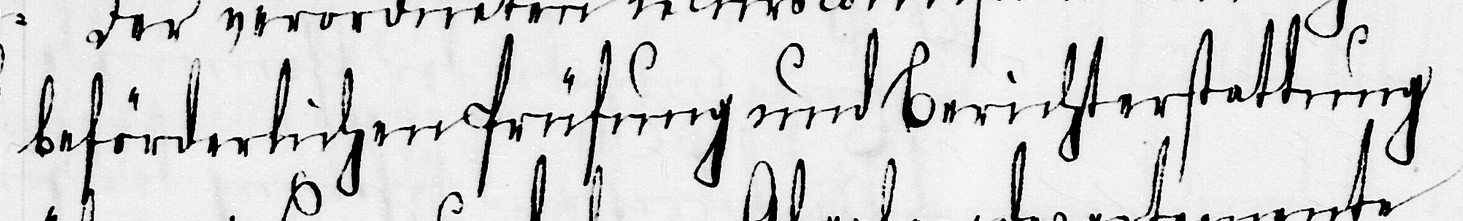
beförderlichen Prüfung und Berichterstattung
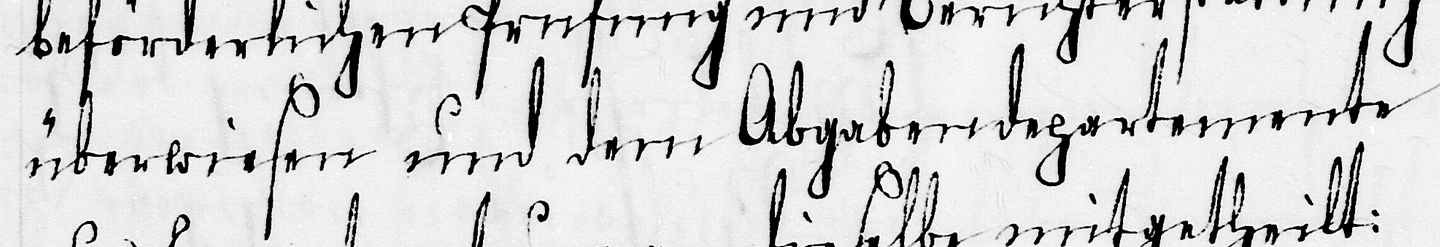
überwiesen und dem Abgabendepartemente
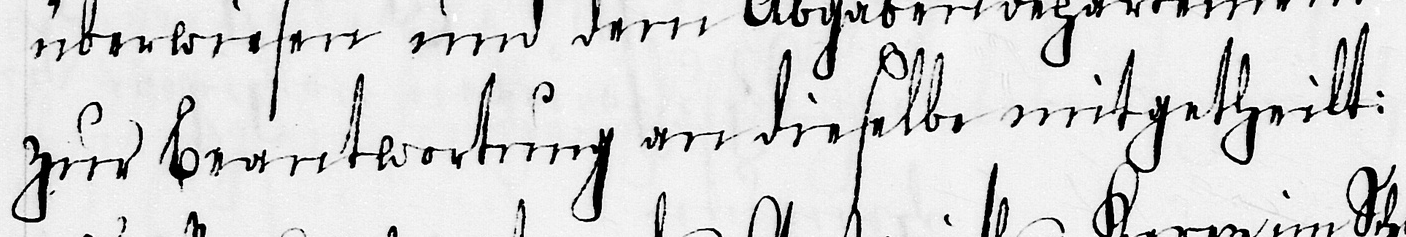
zur Beantwortung an dieselbe mitgetheilt:
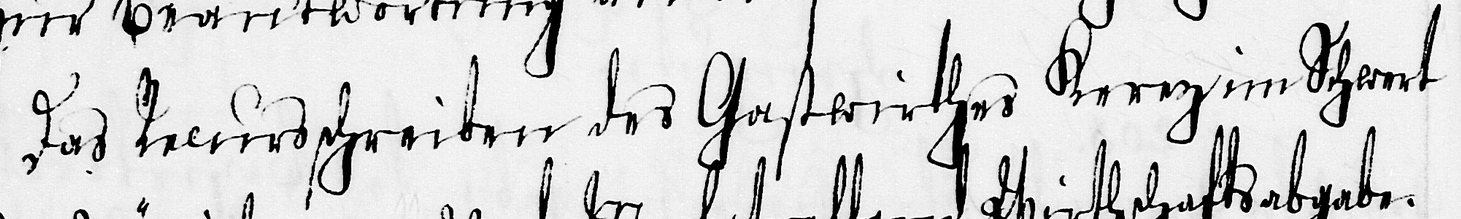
Das Recursschreiben des Gastwirthes Kerez im Schwert
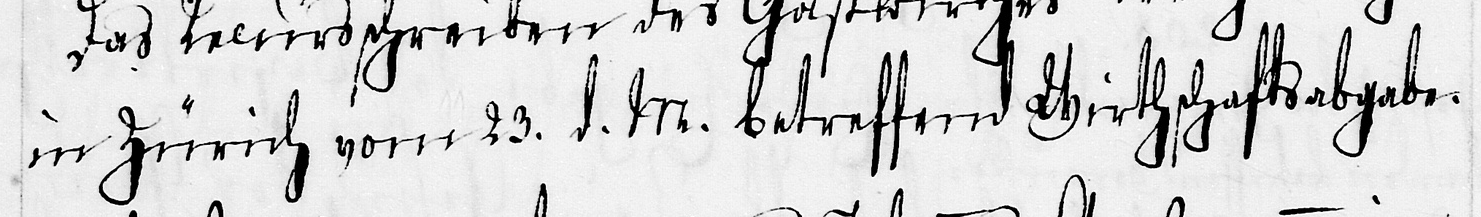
in Zürich vom 23. d. M. betreffend Wirthschaftsabgabe.
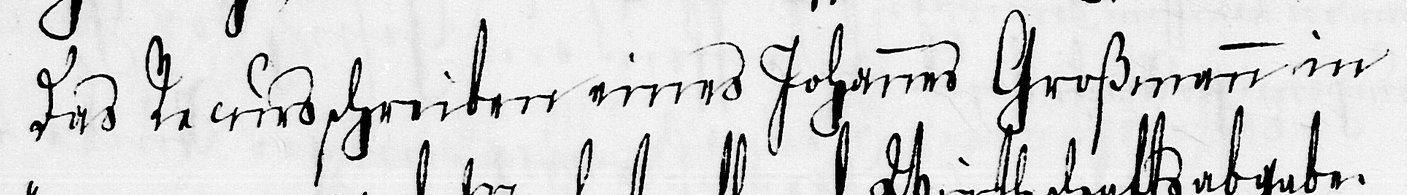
Das Recursschreiben eines Johannes Großmann in
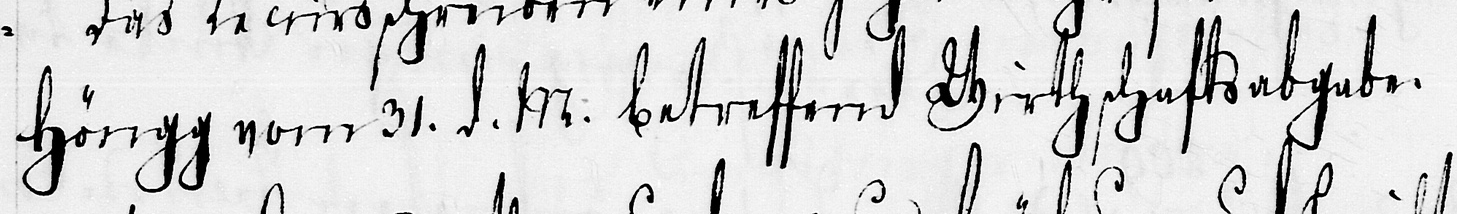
Höngg vom 31. d. M. betreffend Wirthschaftsabgabe.
